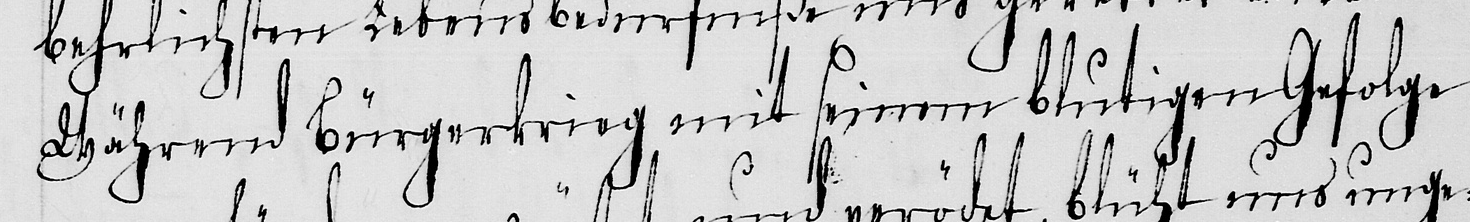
Während Bürgerkrieg mit seinem blutigen Gefolge
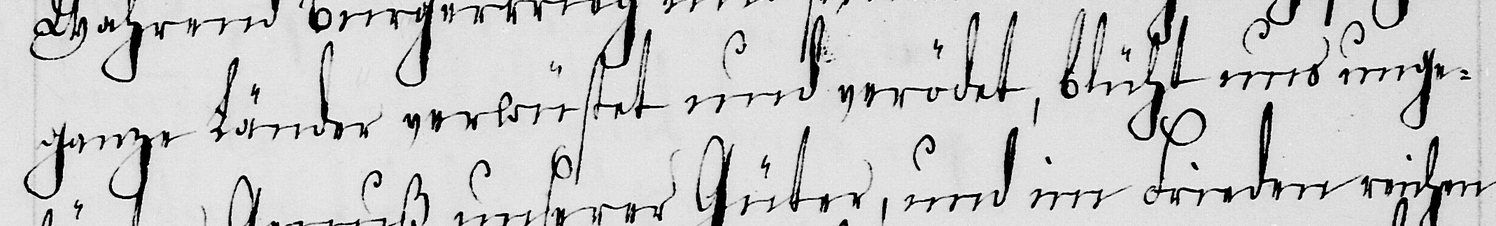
ganze Länder verwüstet und verödet, blüht uns unge¬
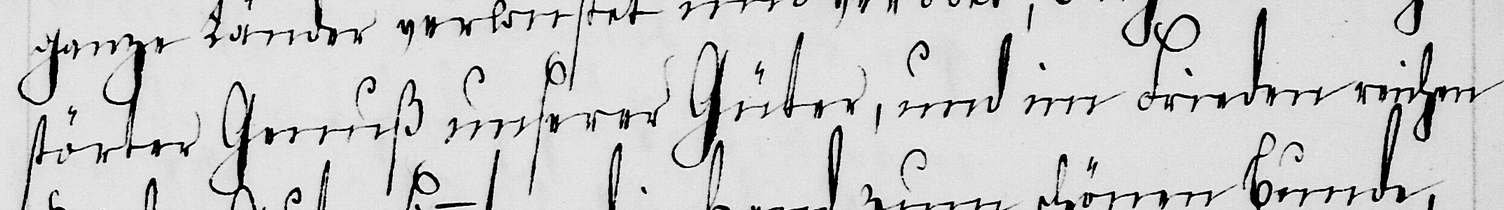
störter Genuß unserer Güter, und im Frieden reichen
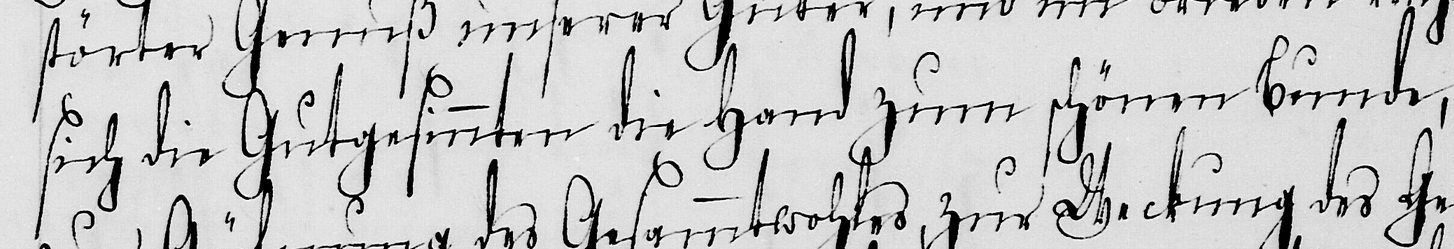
sich die Gutgesinnten die Hand zum schönen Bunde,
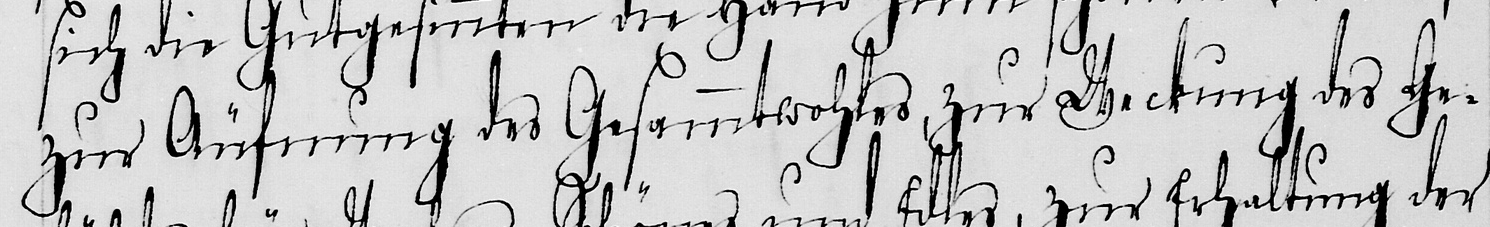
zur Ausführung des Gesamtwohles, zur Weckung des Ge¬
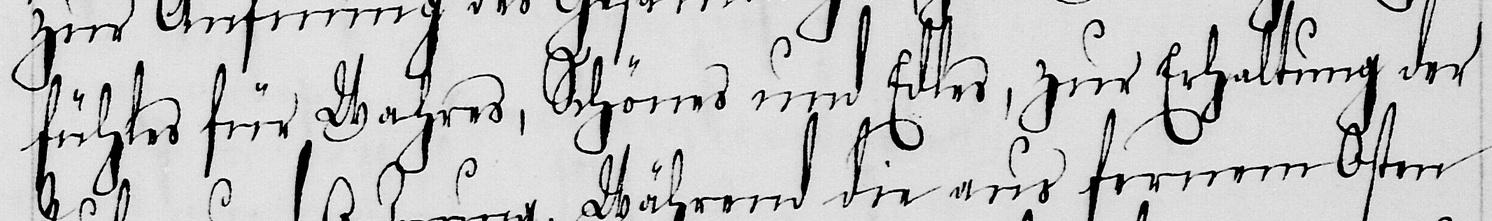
fühles für Wahres, Schönes und Edles, zur Erhaltung der
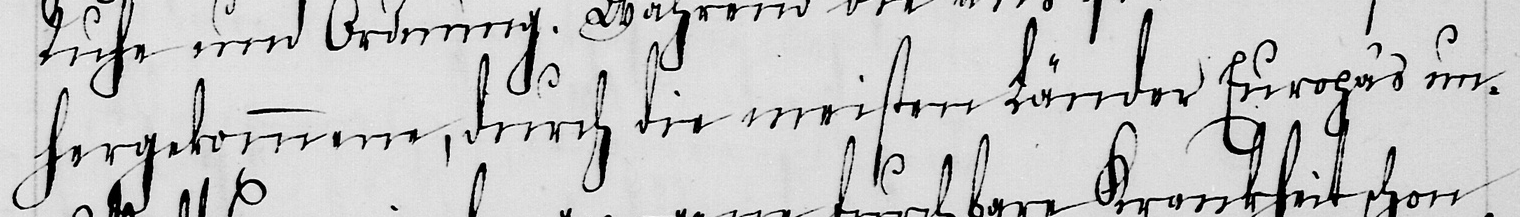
hergekommene, durch die meisten Länder Europas un¬
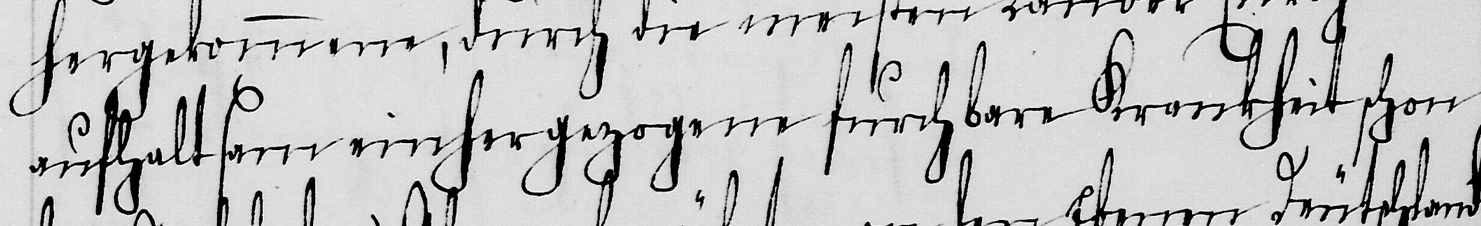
aufhaltsam einhergezogene furchbare Krankheit schon
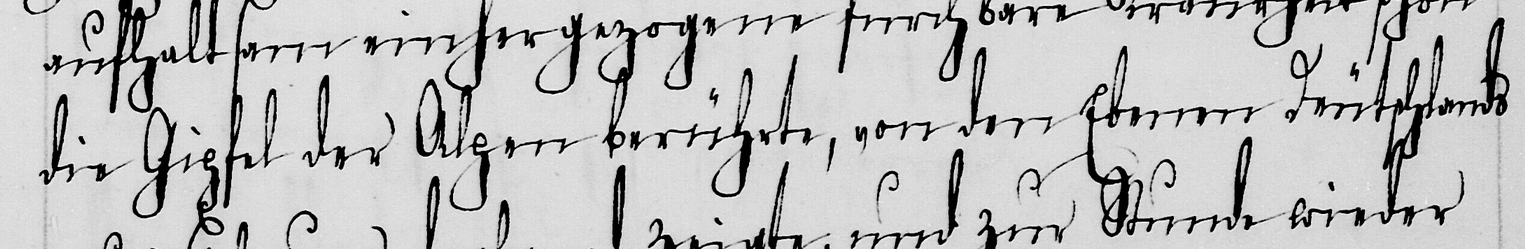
die Gipfel der Alpen berührte, von den Ebenen Deutschlands
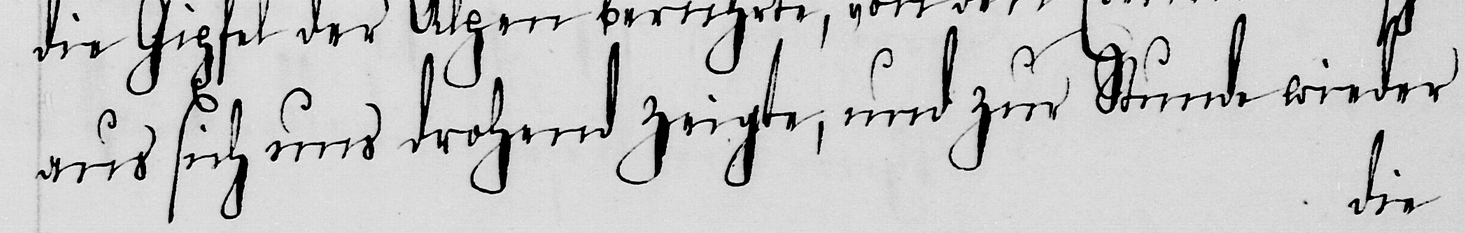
aus sich uns drohend zeigte, und zur Stunde wieder
